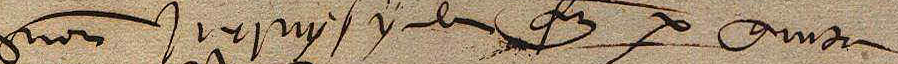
Sn̄or Jnquysydor fez ꝑgunta
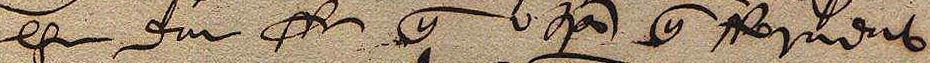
lhe dar ffe q̄ o tpō q̄ ffora dado
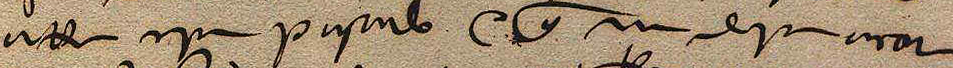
a Re era pasado e q̄ eu dera a car
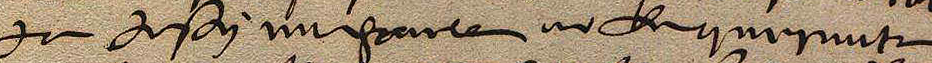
ta testymunhauell ao Requeremte
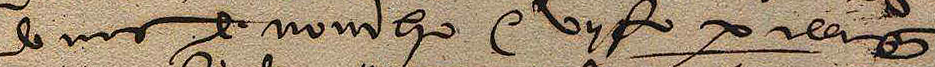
do mes de nouēbro e vysto ꝑ elle s̄or
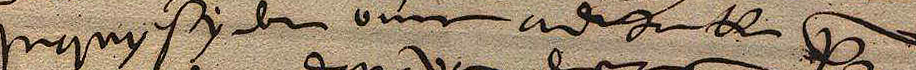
Jnquysydor ouue a dita Re p̄o
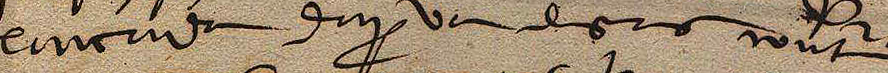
lançada da ꝓva de suas contra
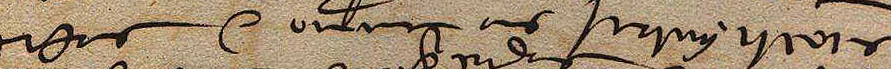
ditas e ouue as Jnquyrjçoes
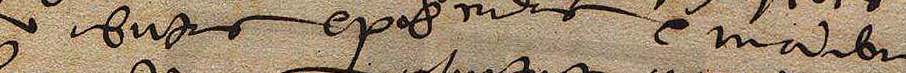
p̄o abertas e pobicadas e mādou
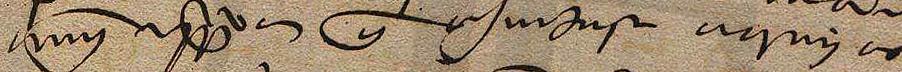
a mj̄ esp̄vam q̄ aJuntase aquy as
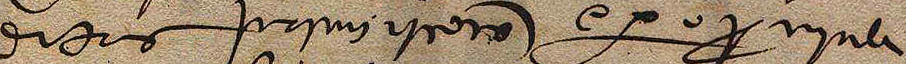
ditas Jnquyrjçoẽs e ꝑ o ꝓcurador
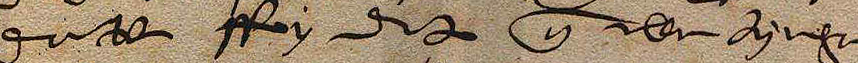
da Re ffoy dito q̄ elle tynha
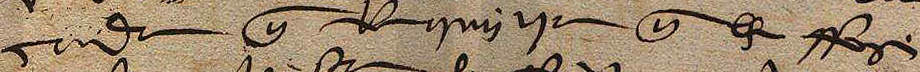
çada q̄ Requyrja q̄ lhe ffose
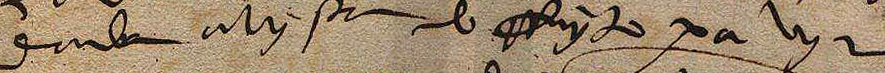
dada a vysta do ffeyto ꝑa vyr
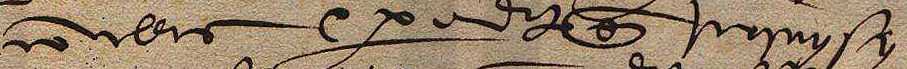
cō elles e ꝑ o dito s̄or Jnquysy
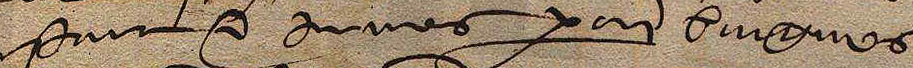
estaua ē termos ꝑa ēbarguos
